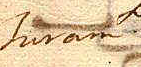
Iuramto.
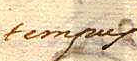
tempus
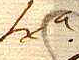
Lxa.
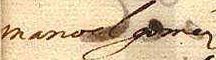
manoel gomēz
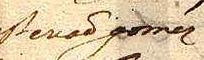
esteuaõ gomēz
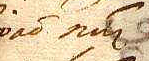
oaõ roīz
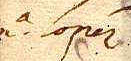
ma. lopez̄
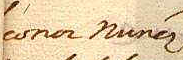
eonor nunēz
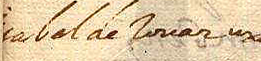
sabel de Touar uxor
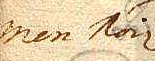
men Rōiz
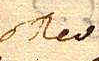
o Reo
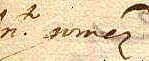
An.to nunez̄
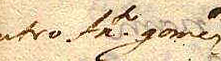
utro Anto. gomēz
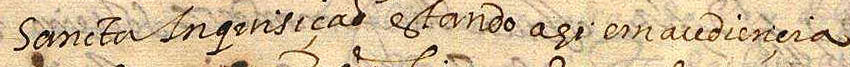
Sancta Inquisiçaõ estando ahi em audiencia
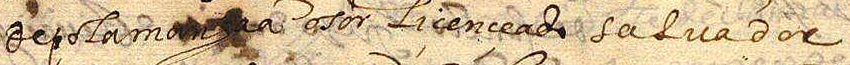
de pola manhaā o sōr Licenceado saluador
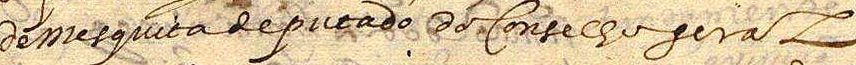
de mesquita deputado do Conselho geraL
